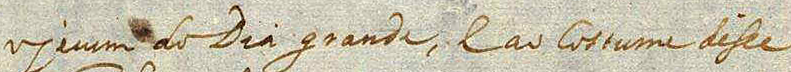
o jeium do Dia grande, E ao Costume disse
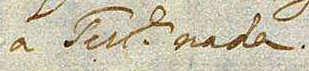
a Test.a nada.
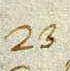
23
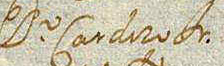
D.o Cardozo Ir.
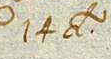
14 d̄.o
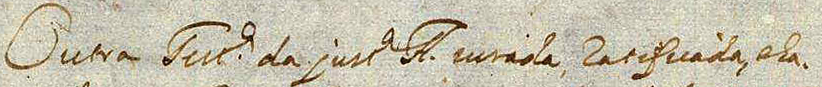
Outra Test.a da justa A. iurada, Ratificada, e ha
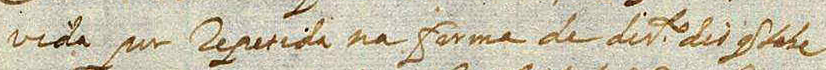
vida per Repetida na forma de dir.to dis q̄ sabe
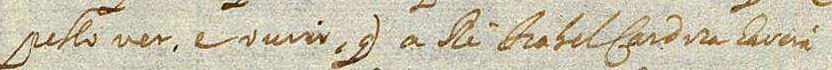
pello uer, e ouvir, q̄ a Ré Izabel Cardoza haverá
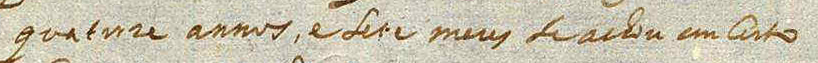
quatorze annos, e sete mezes se achou em Certo
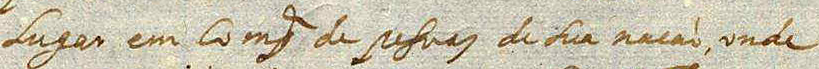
Lugar em Compa de peSsoas de sua naçaõ, onde
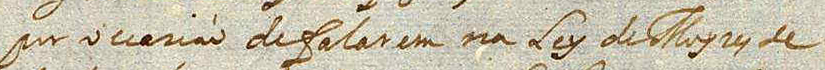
por occaziaõ de falarem na Ley de Moyzes se
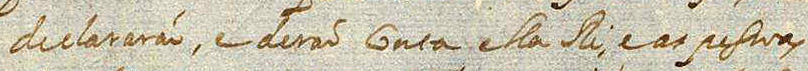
declararaõ, e deraõ conta ella Ré, e as pessoas
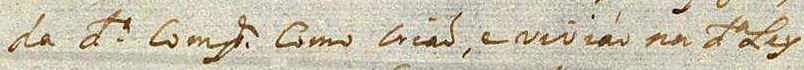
da d̄.a Comp.a Como criaõ, e viviaõ na d̄a Ley
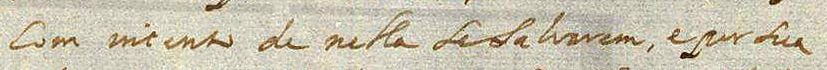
Com intento de nella se Salvarem, e por sua
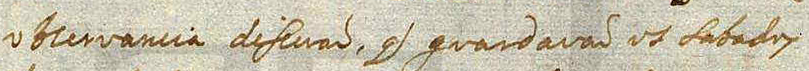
observancia disseraõ, q̄ guardavaõ os sabados
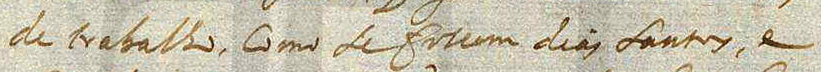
de trabalho, Como se fossem dias santos, e
